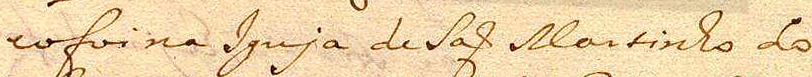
e o foi na Igreja de Saõ Martinho do
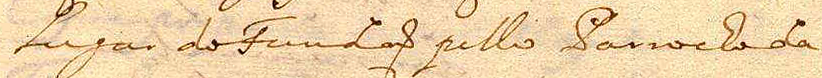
Lugar do Fundaõ pello Parrocho da
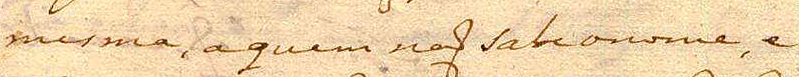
mesma, a quem naõ sabe o nome, e
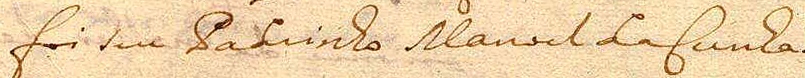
foi seu Padrinho Manoel da Cunha.
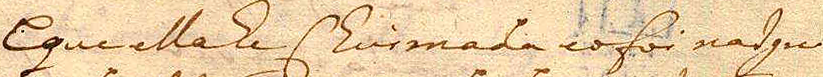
E que ella he Chrismada e o foi na Igre
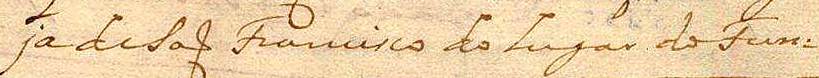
ja de Saõ Francisco do Lugar do Fun
